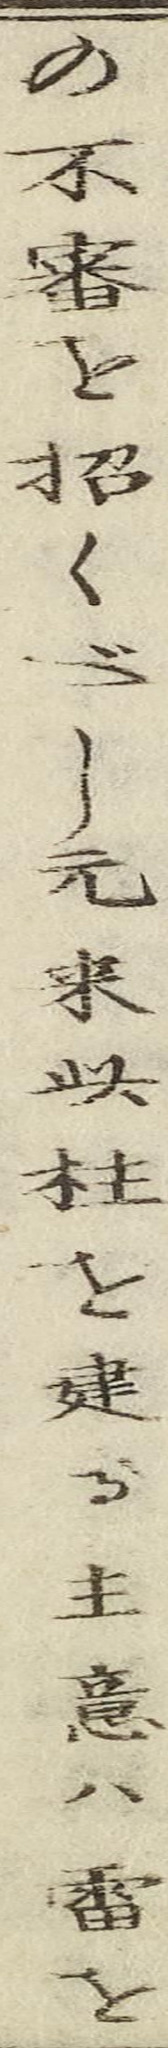の不審を招くべし元来此柱を建る主意は雷を
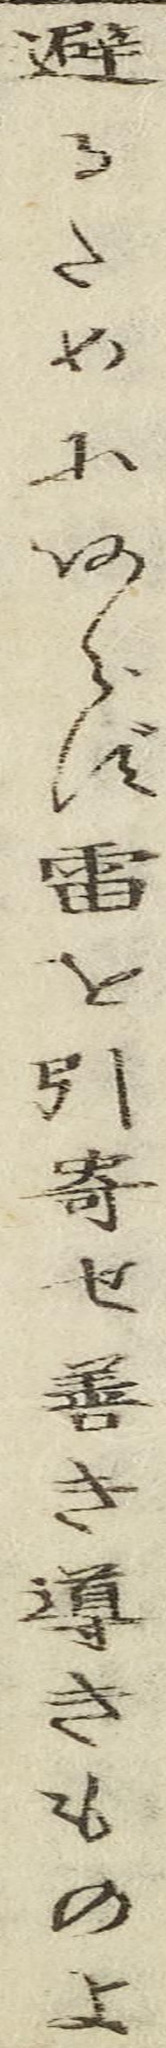避るためにあらず雷を引寄せ善き導きものよ
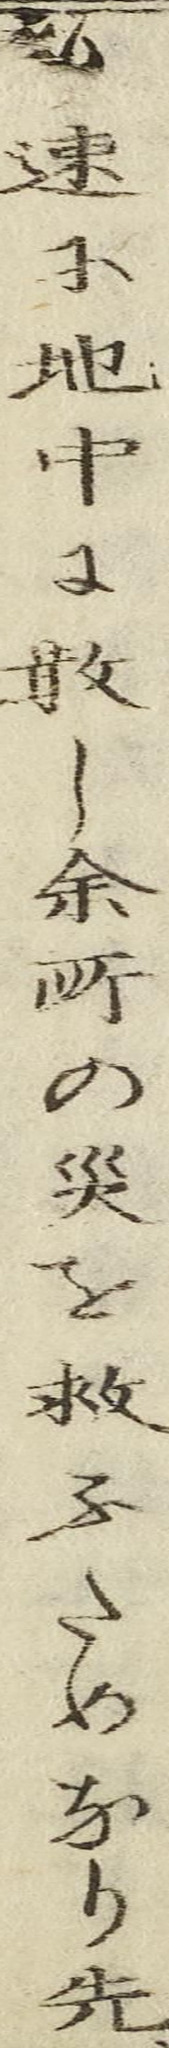り速に地中に散し余所の災を救ふためなり先ツ
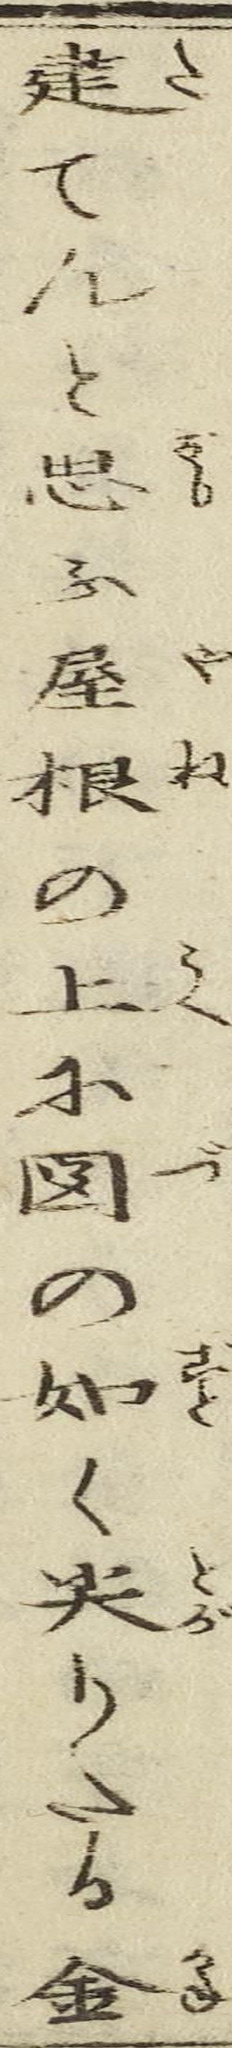建てんと思ふ屋根の上に図の如く尖りたる金
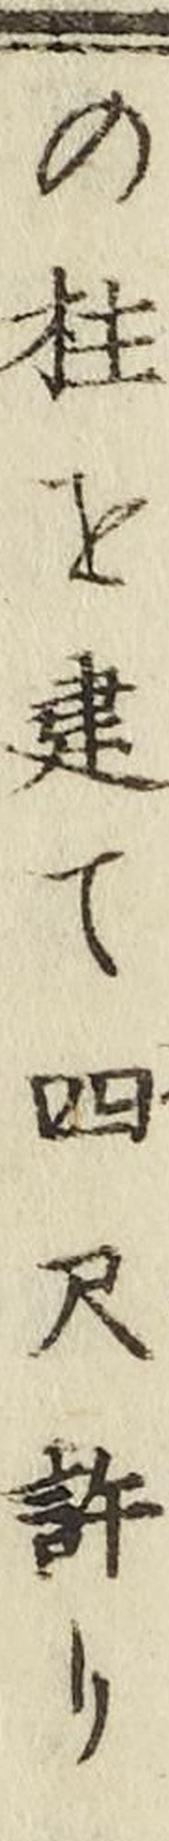の柱を建て四尺許り
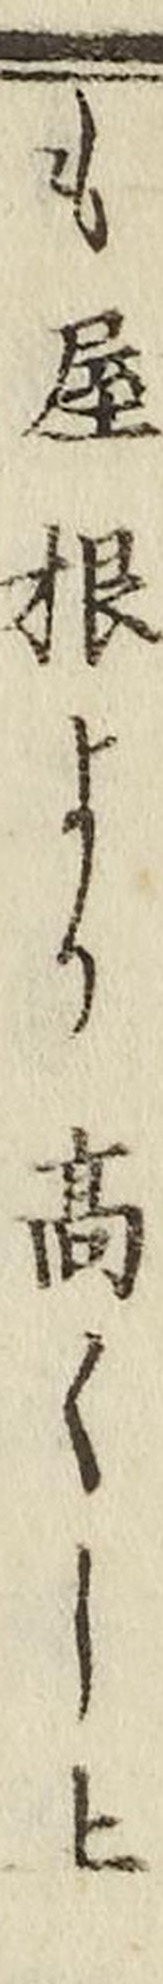も屋根より高くし上
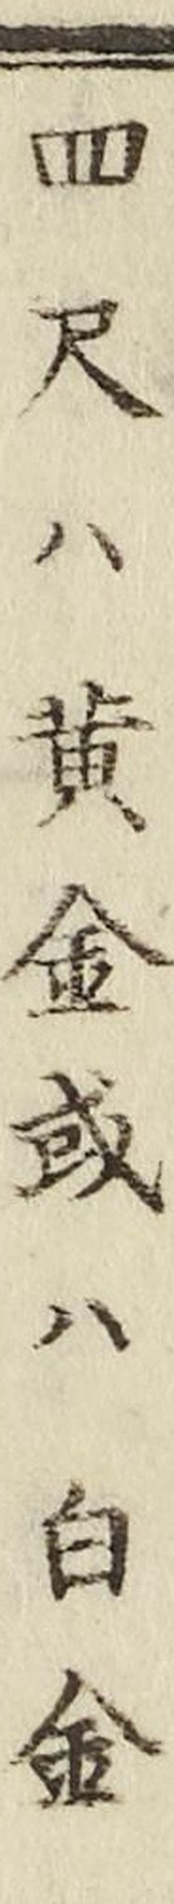四尺は黄金或は白金
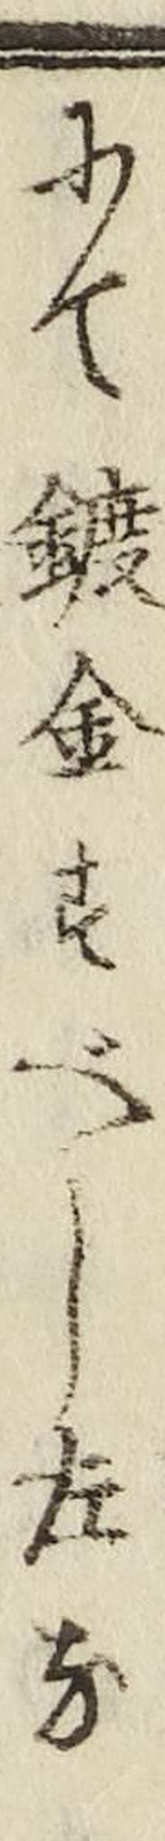にて鍍金すべし左な
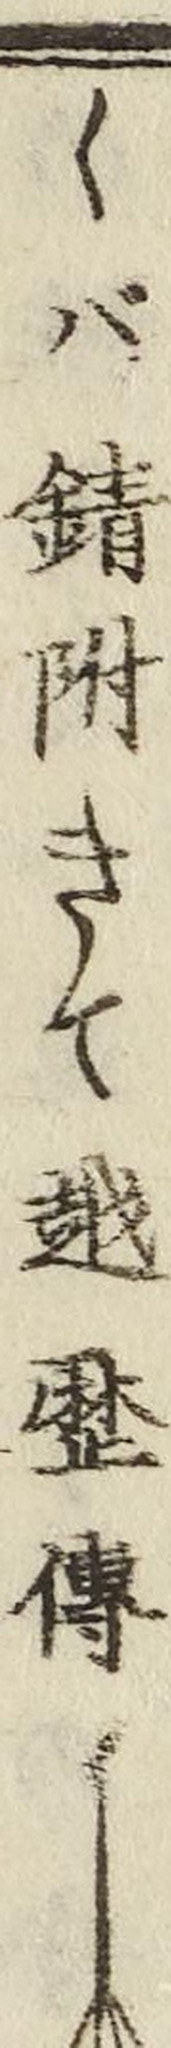くば錆附きて越歴伝
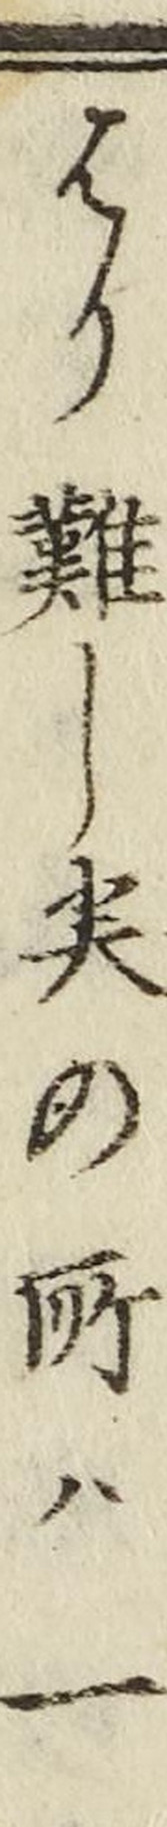はり難し尖の所は一
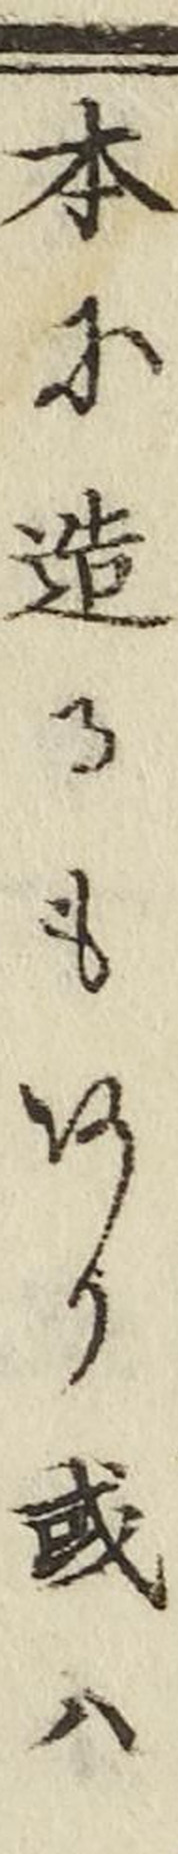本に造るもあり或は
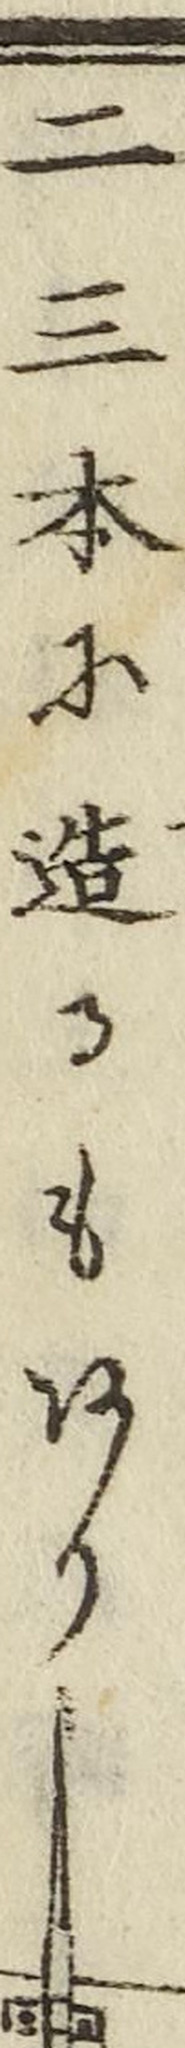ニ三本に造るもあり
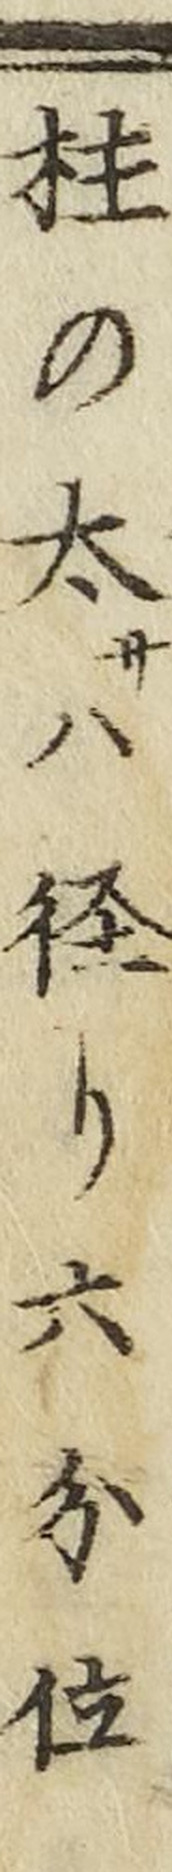柱の太サは径り六分位

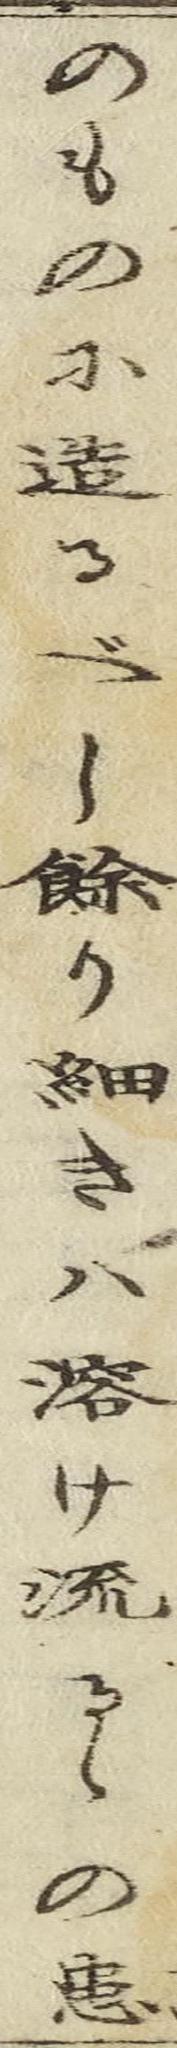のものに造るべし余り細きは溶け流るゝの患
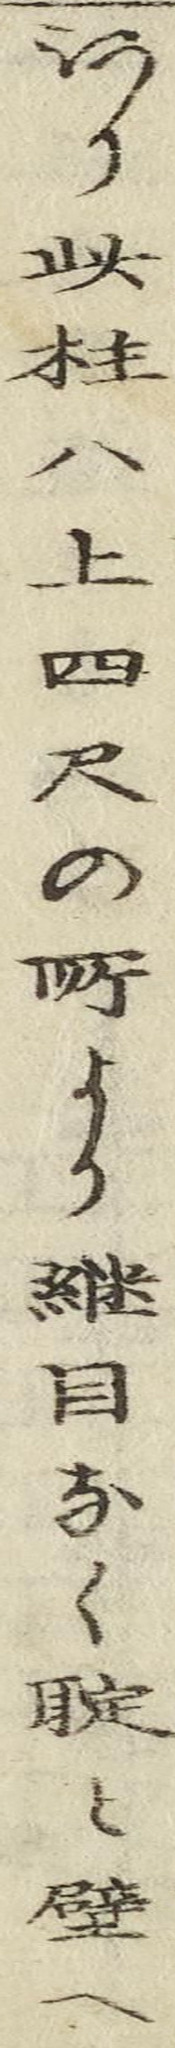あり此柱は上四尺の所より継目なく聢と壁へ
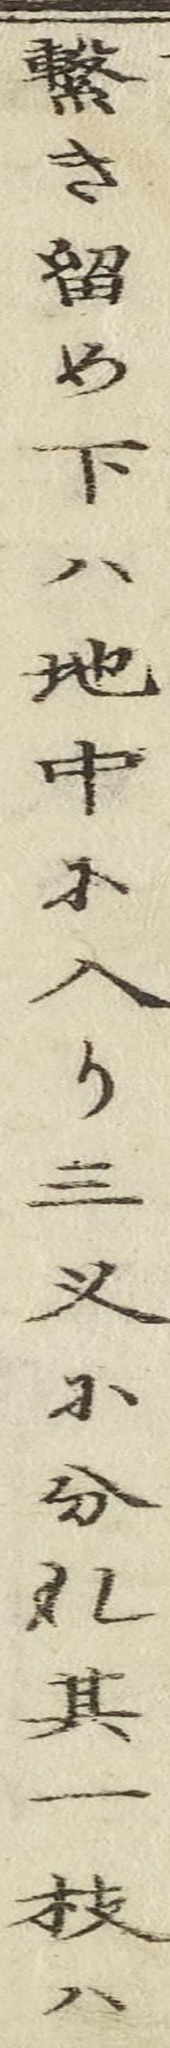繋き留め下は地中に入り三又に分れ其一枝は
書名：天変地異
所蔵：東京大学地震研究所図書室 Earthquake Research Institute Library, The University of Tokyo, JAPAN
